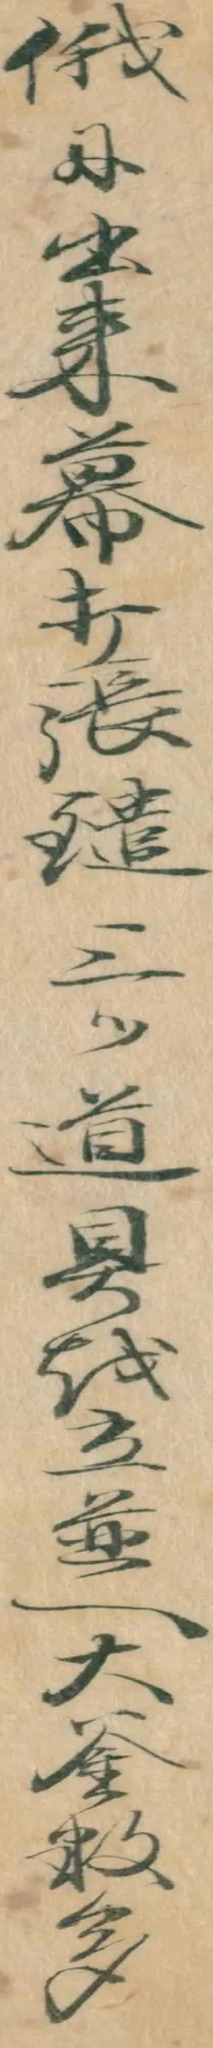俄に出来幕打張鑓三ツ道具を立並へ大釜数多
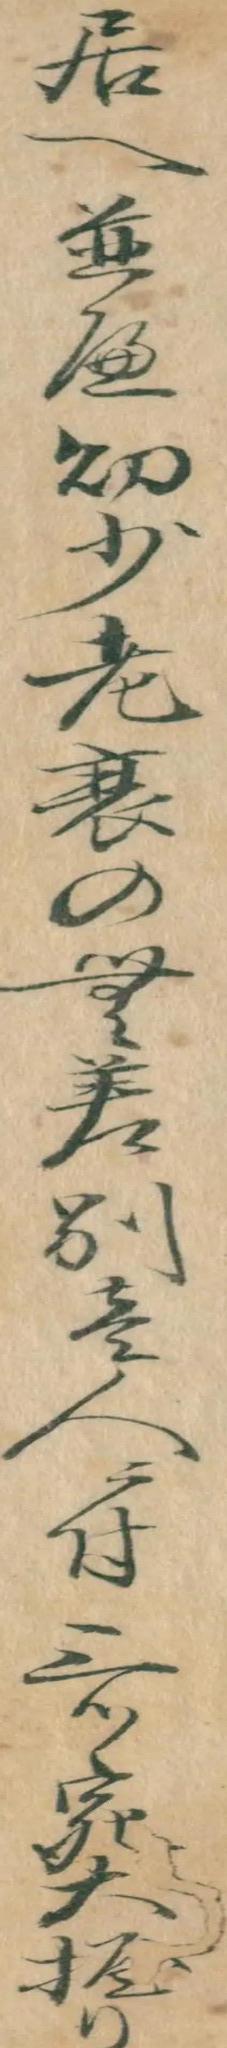居へ並へ幼少老衰の無差別壱人ニ付三ツ宛大握り
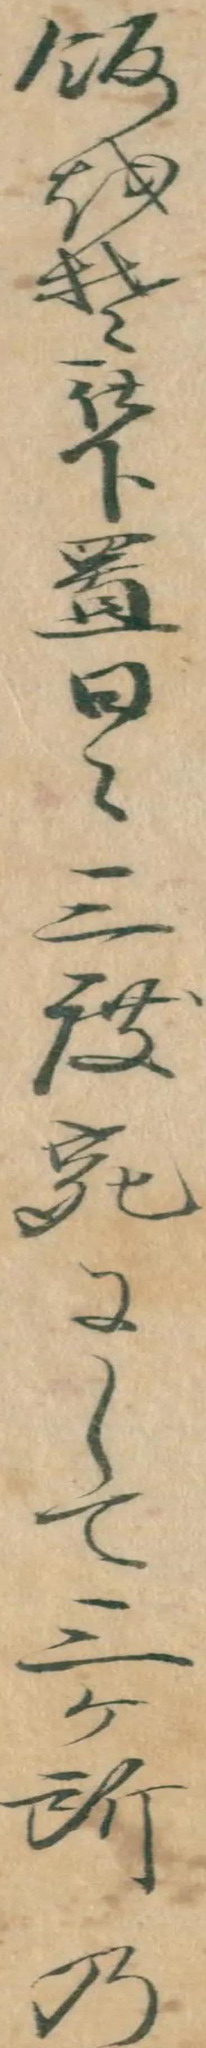飯をそ被下置日〻三度宛にして三ヶ所の
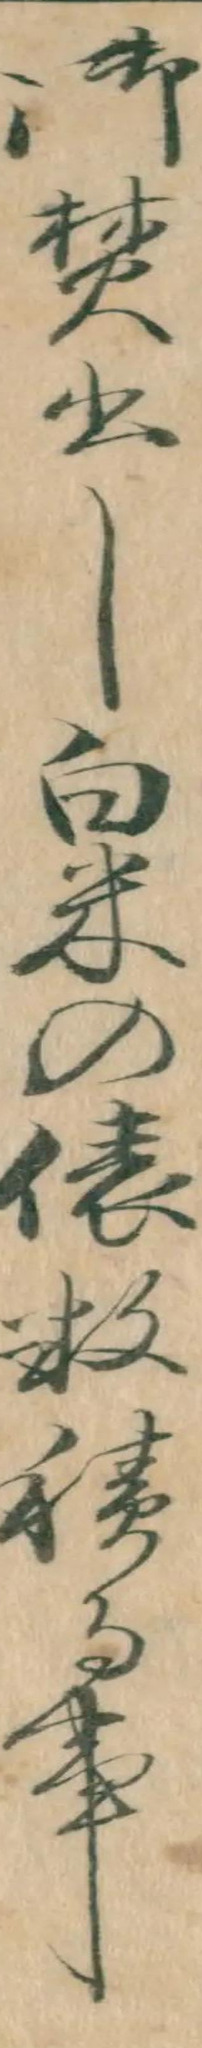御焚出し白米の俵数積る事
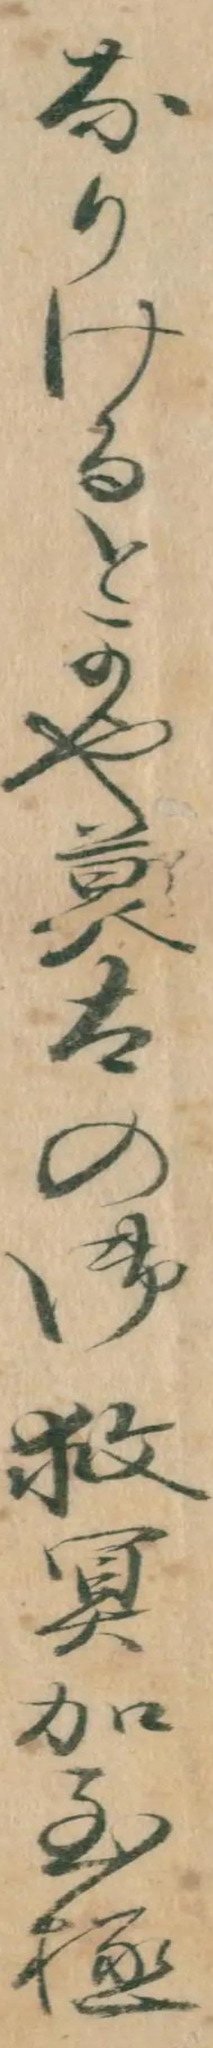なりけるとかや莫太の御救冥加至極
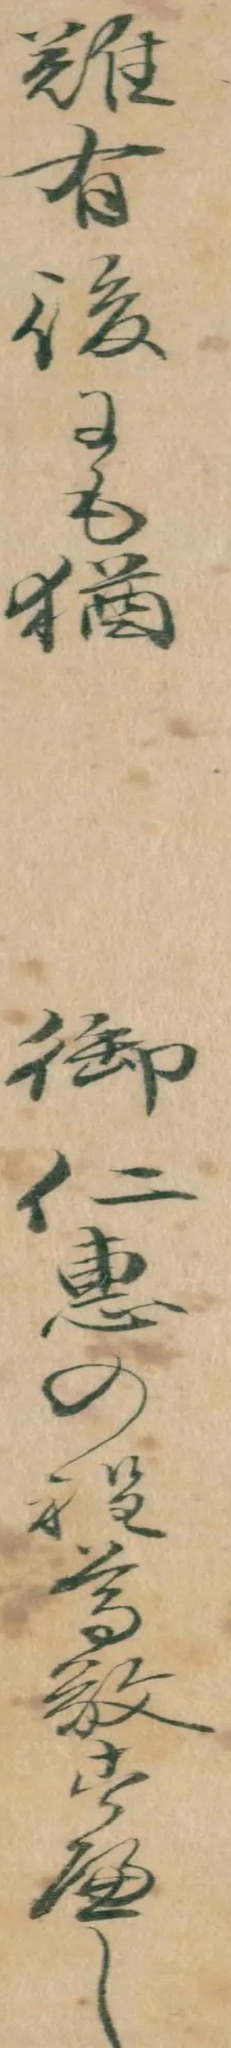難有後にも猶御仁恵の程尊敬すへし
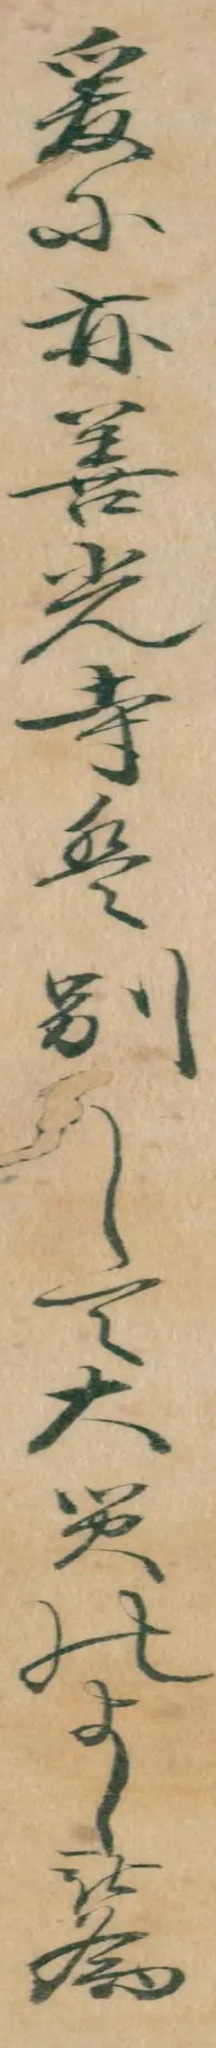爰に亦善光寺は別して大災のよし被為
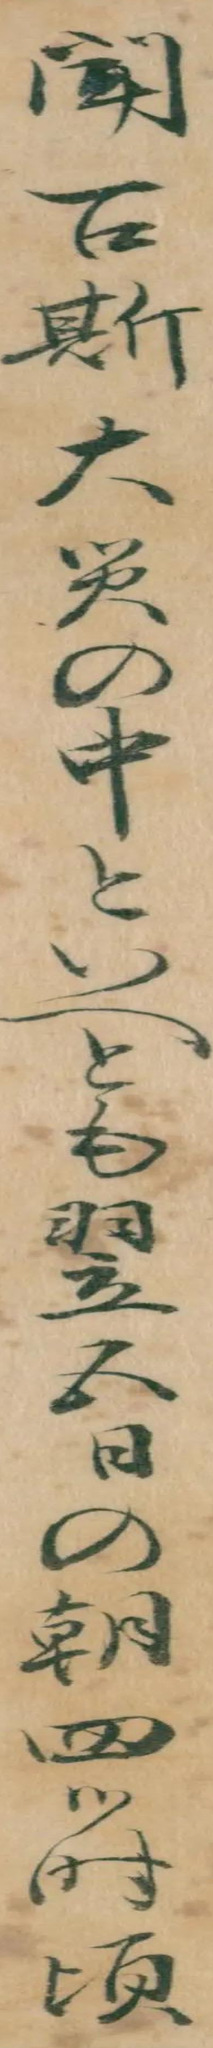聞召斯大災の中といへとも翌五日の朝四ツ時頃
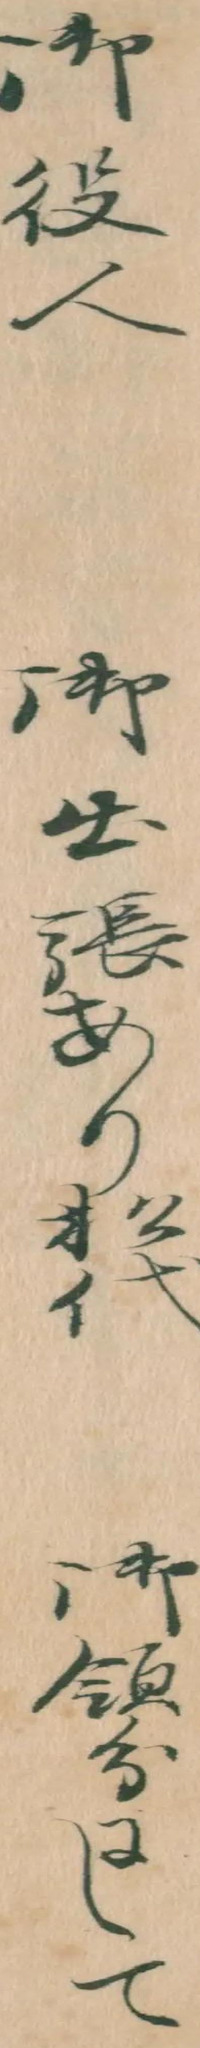御役人御出張あり松代御領分にして
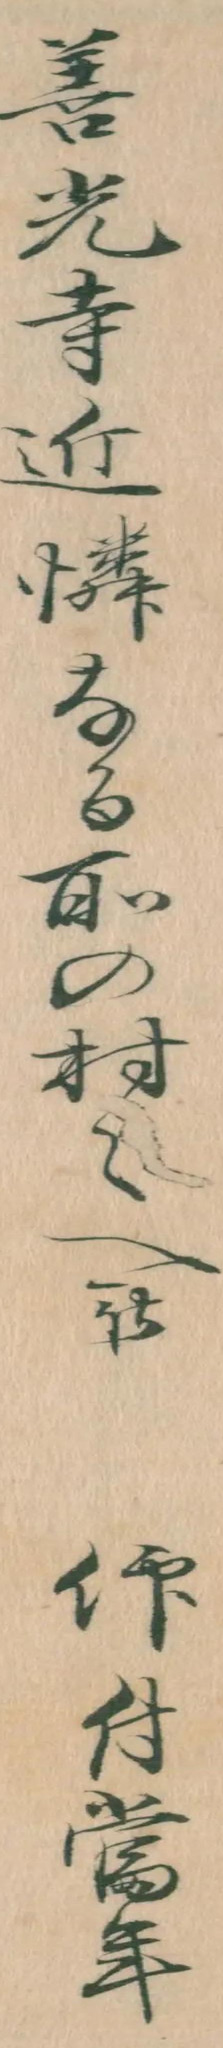善光寺近隣なる所の村〻へ被仰付当年
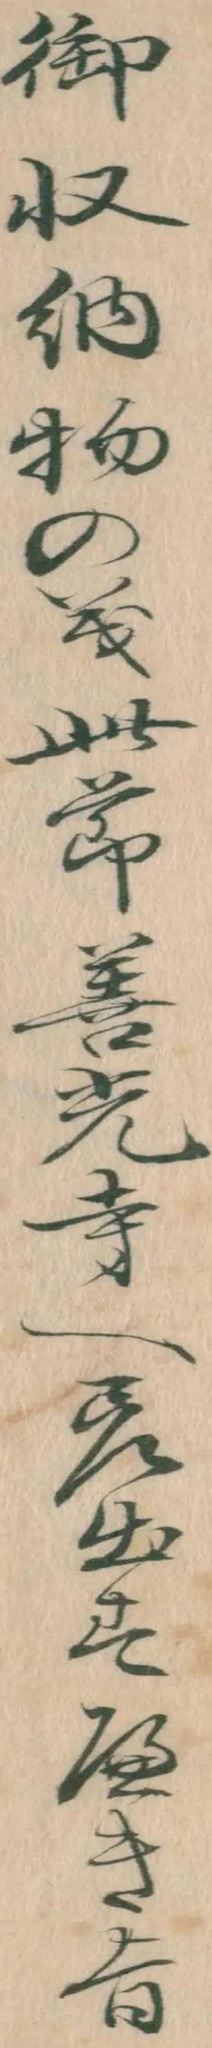御収納物の義此節善光寺へ差出すへき旨
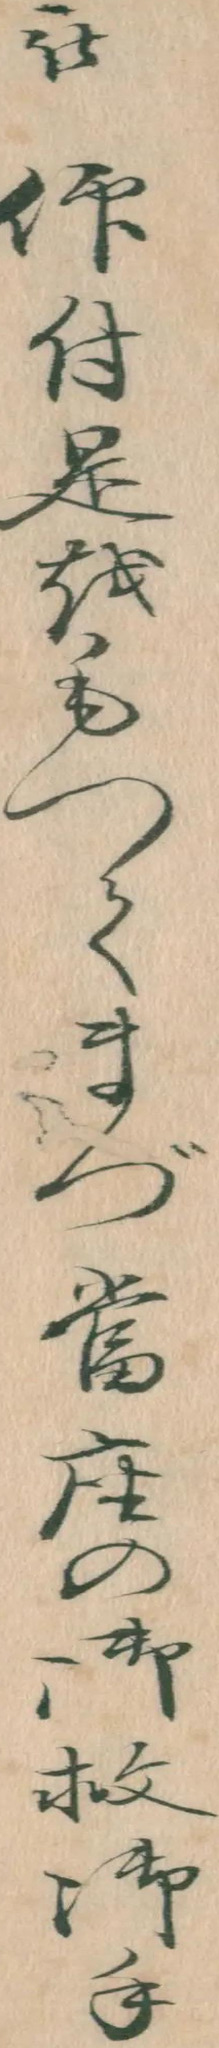被仰付是をもつてまづ当座の御救御手
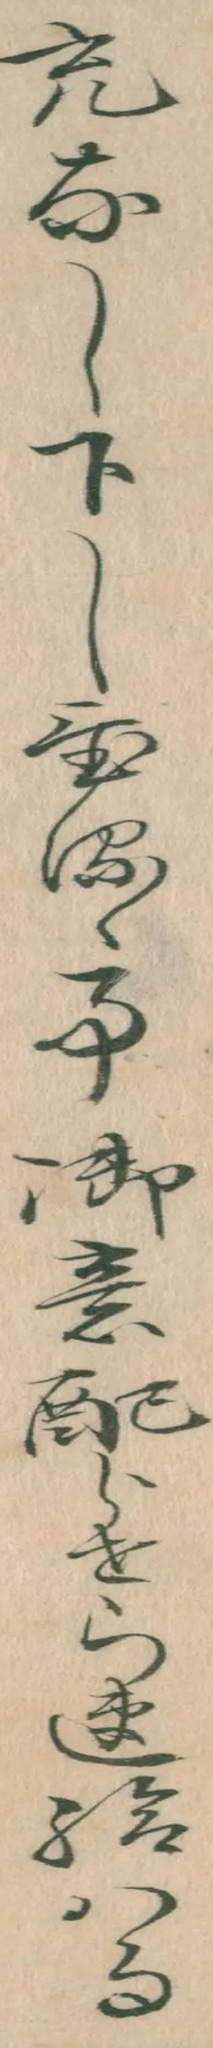充なし下し置るゝ事御意配らせられ給はる
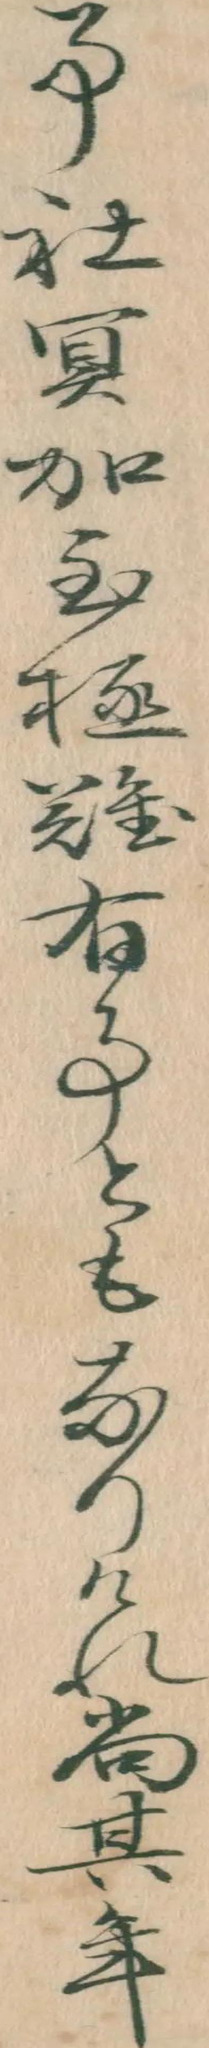事社冥加至極難有事ともなりけれ尚其年
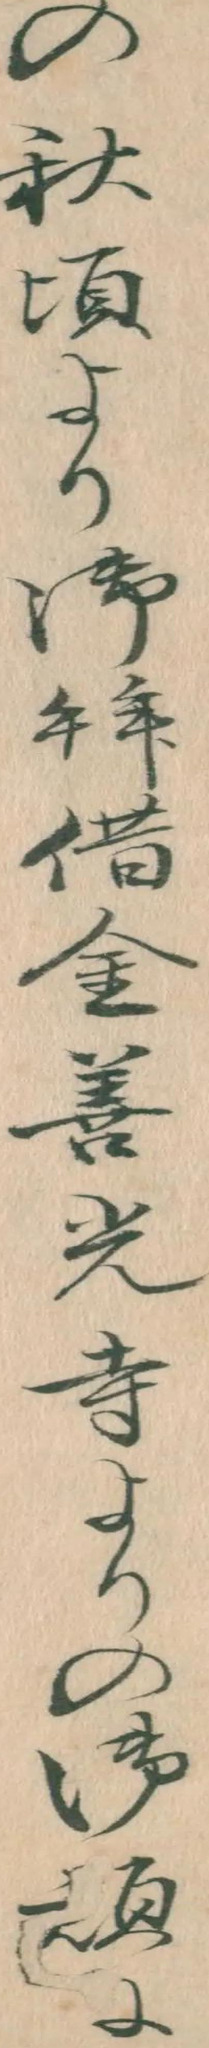の秋頃より御拝借金善光寺よりの御願に
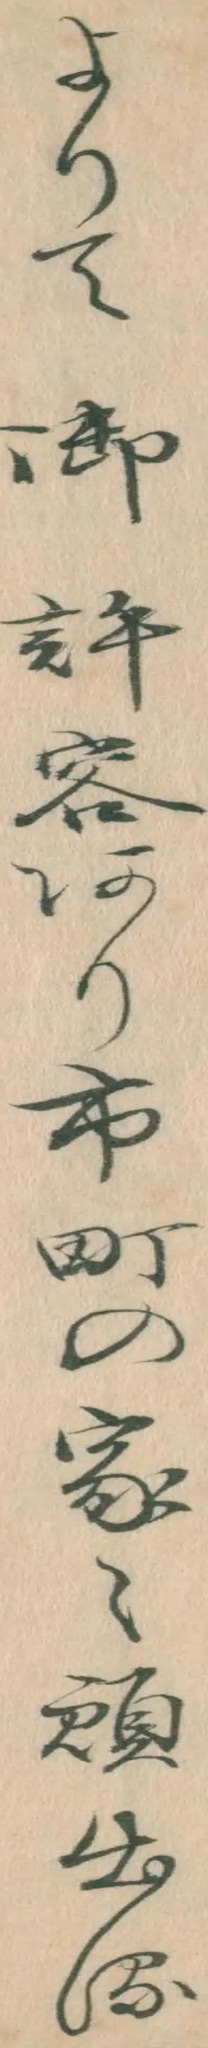よりて御許容あり市町の家〻願出る
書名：俗語之種. [6]
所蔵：国立国会図書館 National Diet Library, JAPAN
